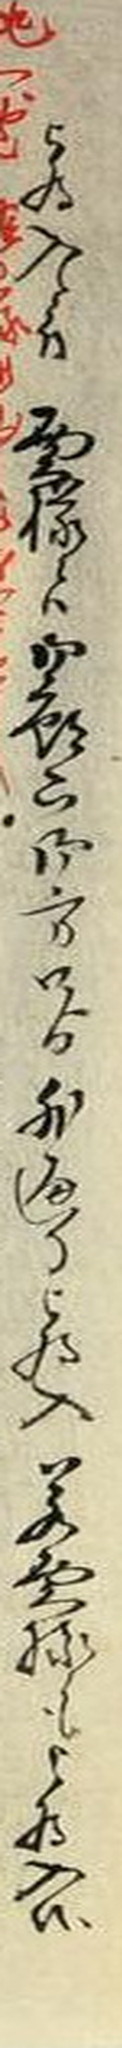被為入候ニ付殿様ニハ御領下御方口ゟ外通り被為入若殿様ニも被為入候
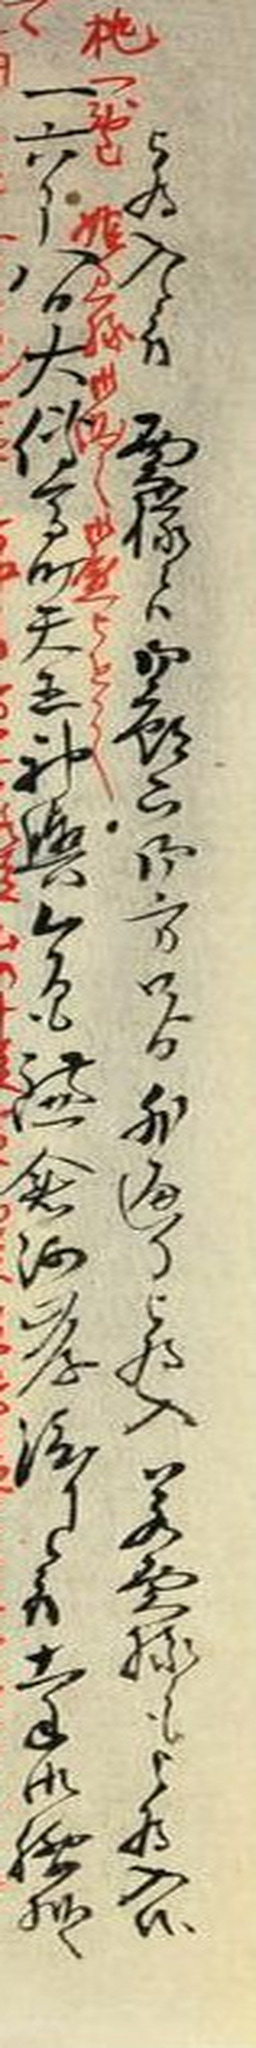一六月八日大伝馬町天王神輿今日も鎌倉河岸渡り候ニ付土手御腰掛へ
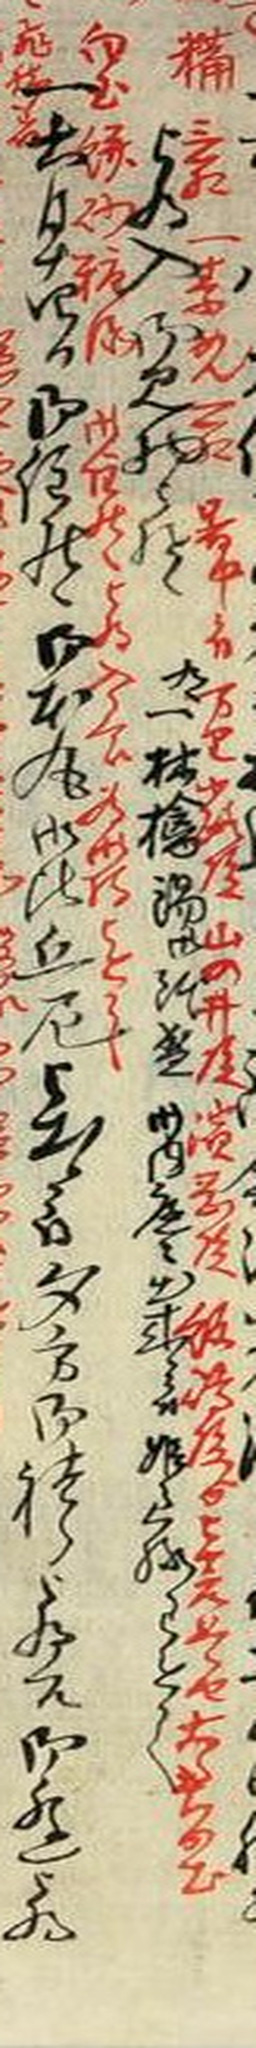一六月十四日御住居へ御本丸御比丘尼被出候ニ付夕方御袴被為召御逢被為
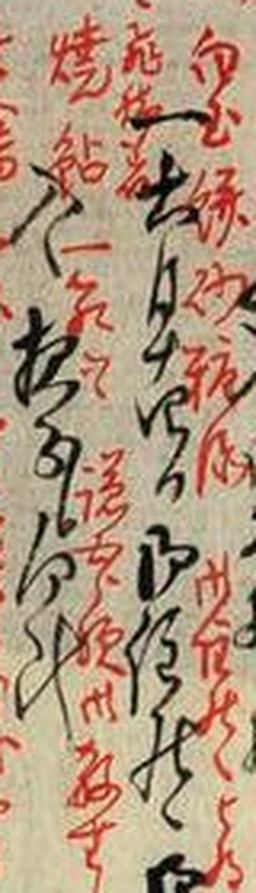入候夜分も同断
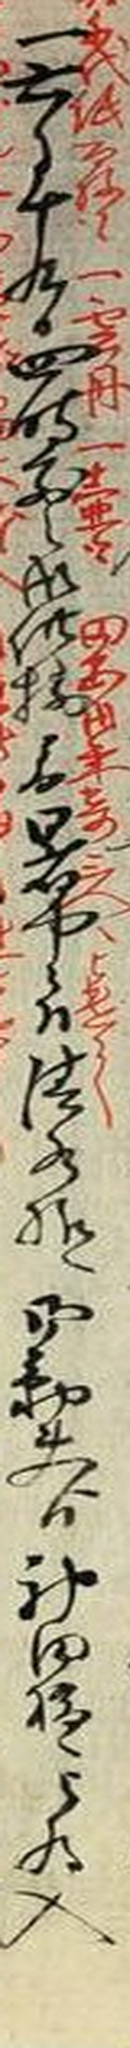一六月十九日四時前之御供揃ニ而暑中ニ付清水様へ御勤夫ゟ神田橋へ被為入
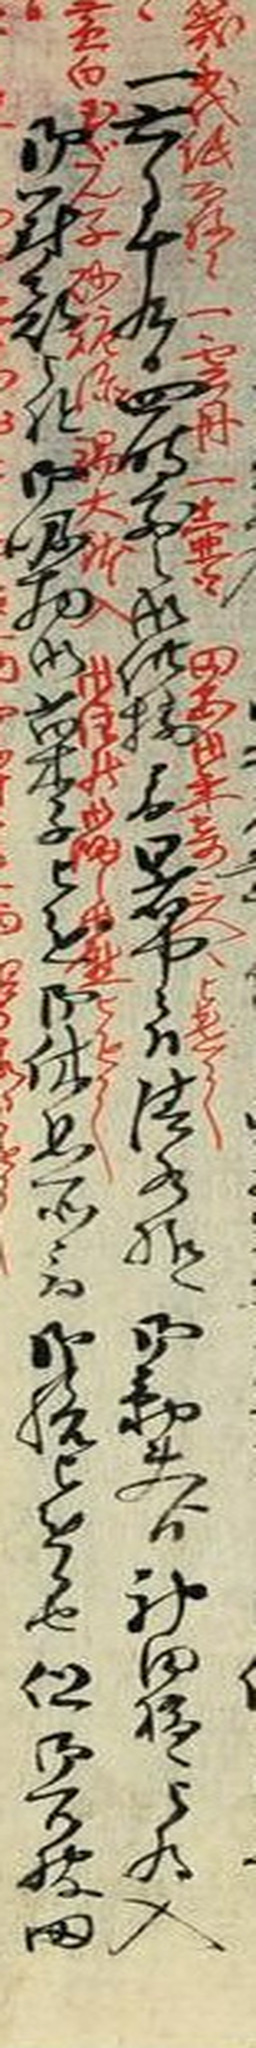御対顔被遊御吸物御菓子被進御休息所ニ而御膳被進候由但御召服田
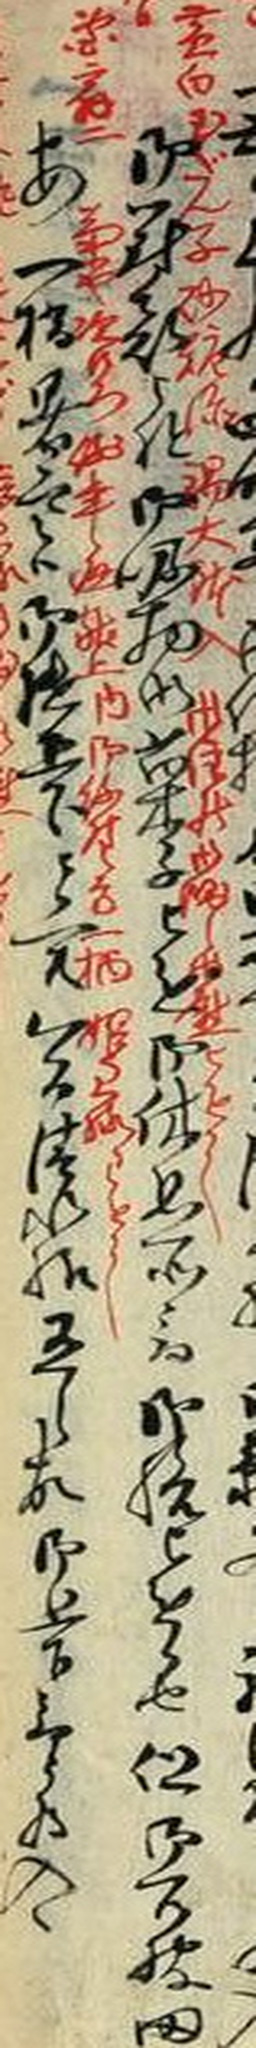安一橋暑寒ハ御継上下ニ候へ共今日清水様有之故御上下ニ而被為入候
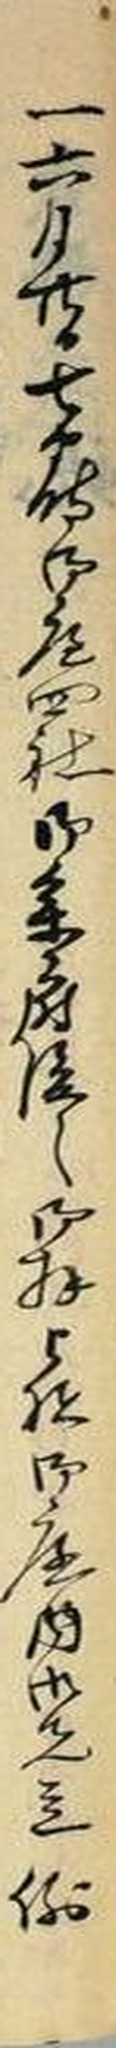一六月廿日七半時御庭四社御参府後之御拝被遊御庭内御先立例
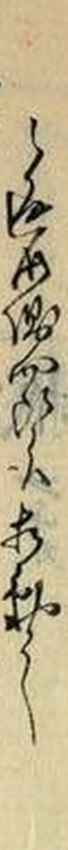之通御側向頭取相勤之
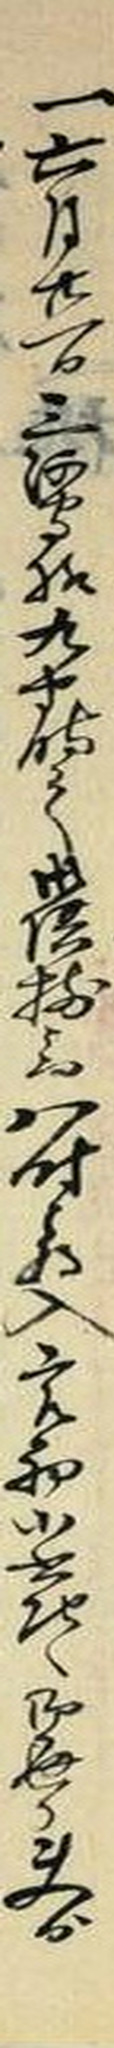一六月廿一日三河守様九半時之御供揃ニ而八時被為入最初小書院へ御通り夫ゟ
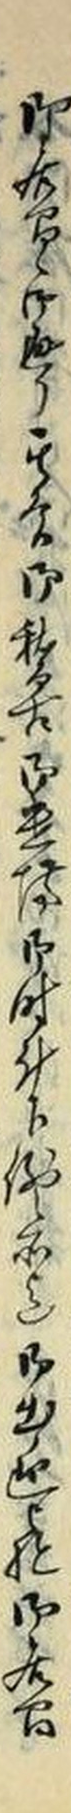御居間へ御通り其節御稽古御遣場御時計下例之所迄御出迎被遊御居間
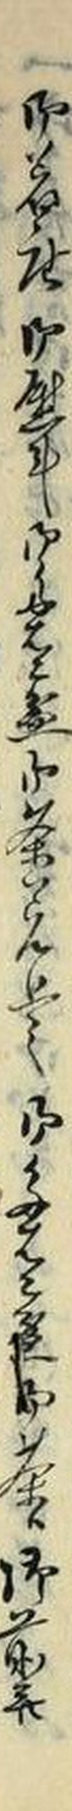御着座御熨斗御たばこ盆御茶差上之御たばこ盆御茶ハ御前并
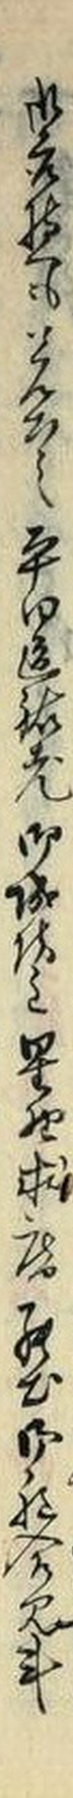御取持へも差出之平田道祐老御城坊主星野求庵罷出御程合見斗
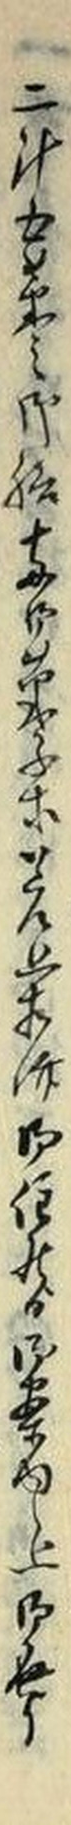二汁五菜之御膳両御菓子等差上相済御住居ゟ御案内之上御通り
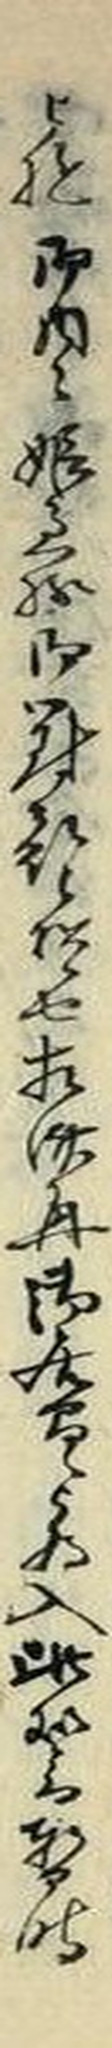被遊御内々姫君様御対顔被遊候由相済再御居間へ被為入此処ニ而暫時
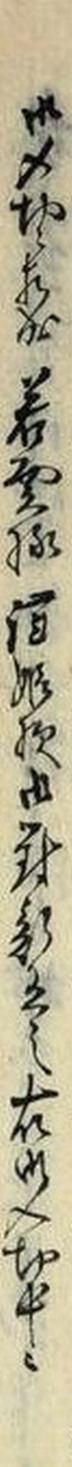御〆切ニ相成若殿様謹姫様御対顔有之右御〆切中ニ
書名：少傅日録抄（斉承付側向頭取日記、在府）
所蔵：福井県文書館 Fukui Prefectural Archives
